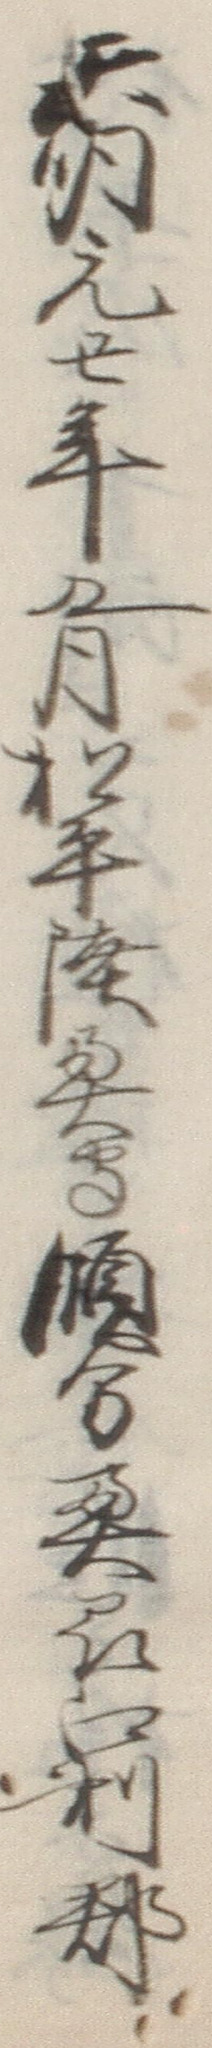天明元丑年九月松平陸奥守領分奥州江刺郡
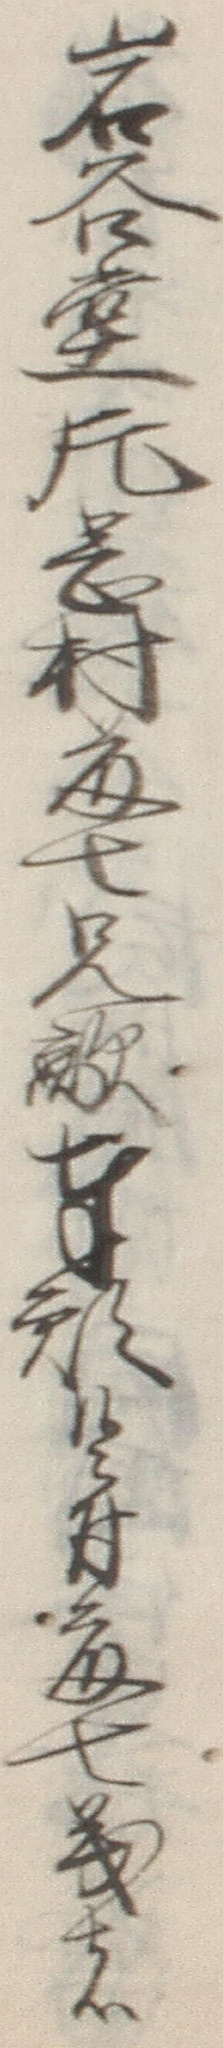岩谷堂片岡村藤七兄献奉願候ニ付藤七義者
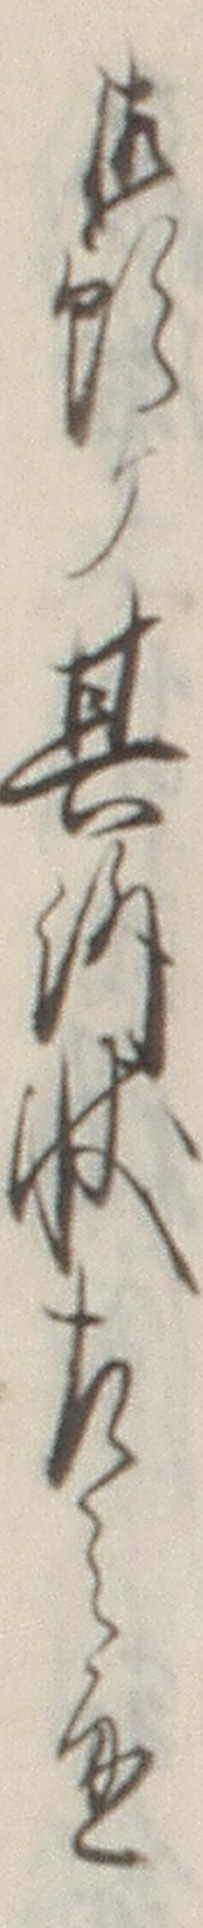御預り其訴状左の通
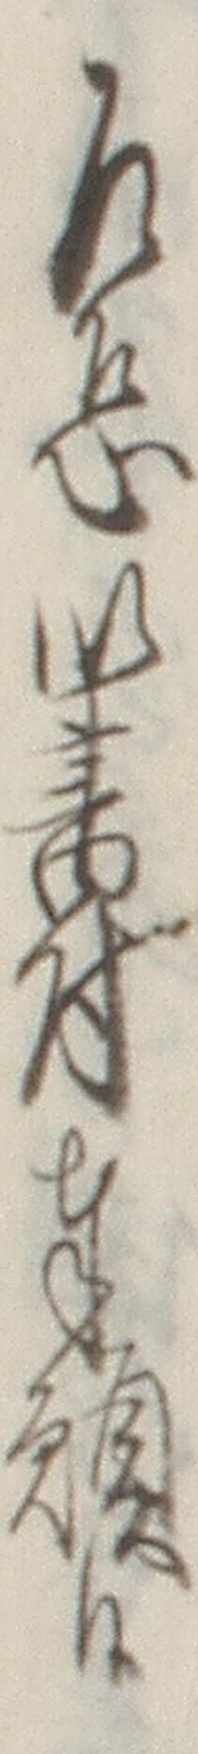乍恐以書付奉願候
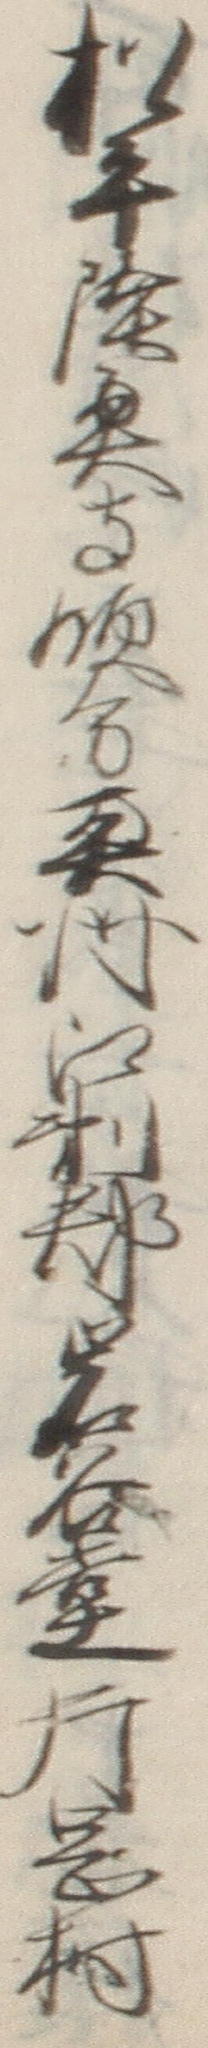松平陸奥守領分奥州江刺郡岩谷堂片岡村

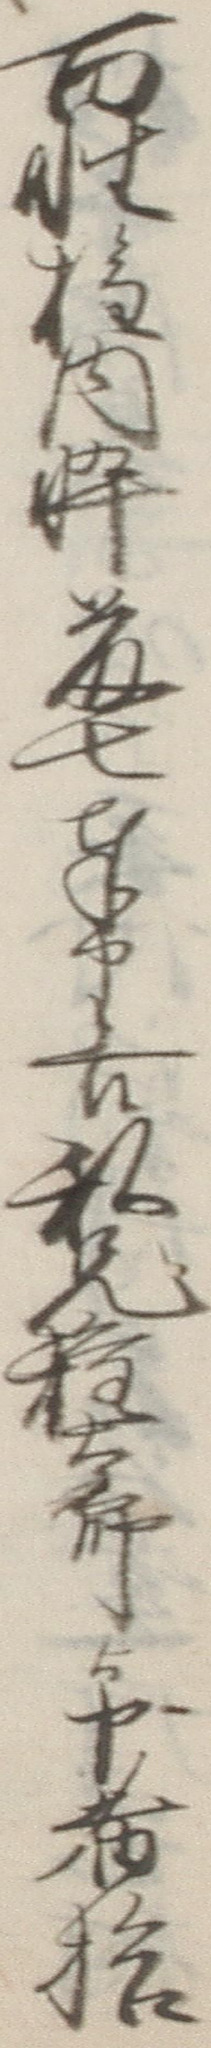百姓権内倅藤七奉申上候私兄権太郎と申者拾
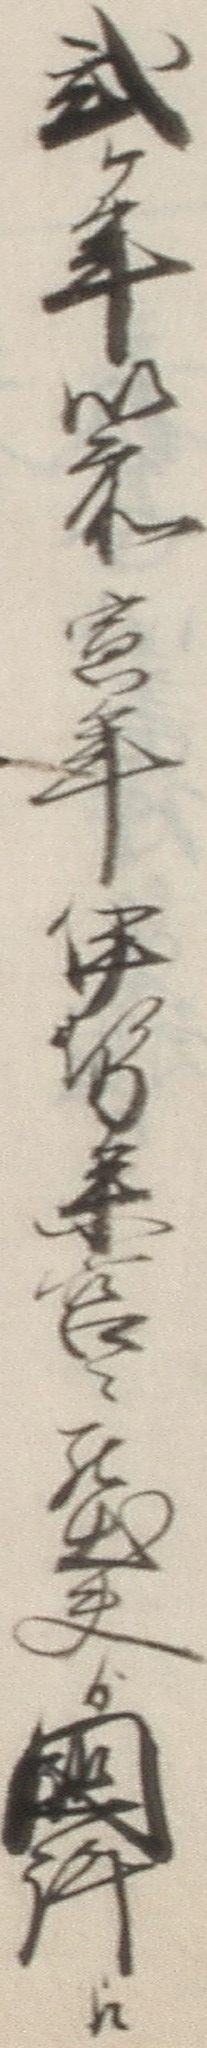弐年以前寅年伊勢参宮ニ罷出夫ゟ国許え
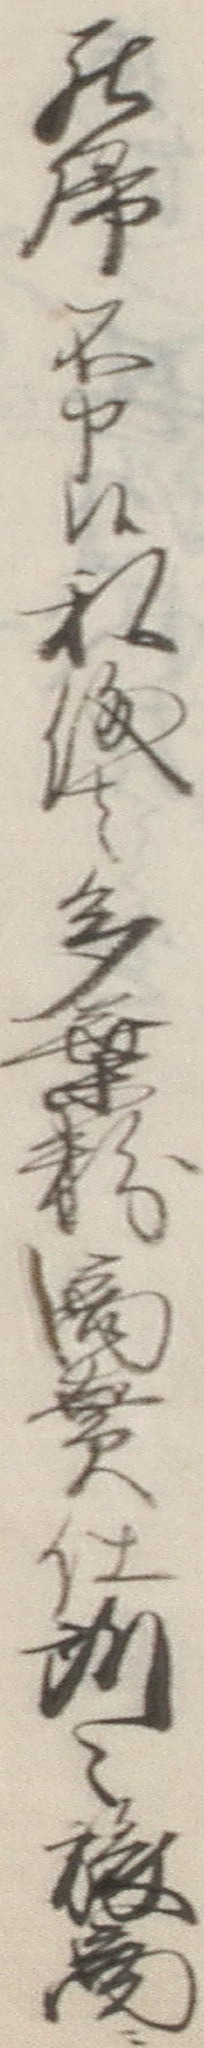罷帰不申候私義は多葉粉商売仕所々旅商
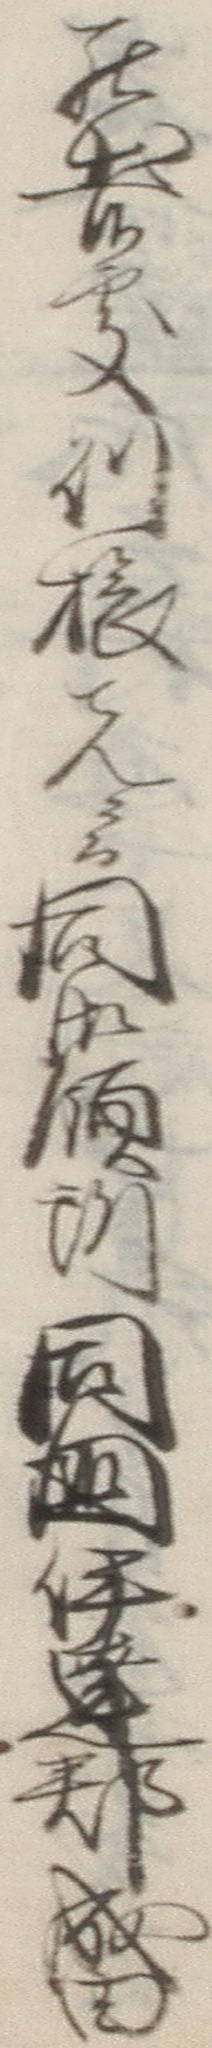罷出候処行旅先ニ而同御領所同国伊達郡成田
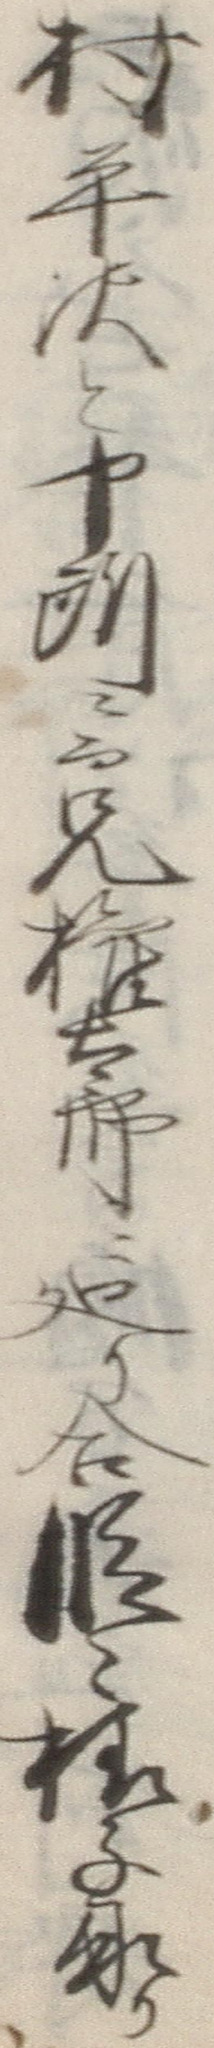村平沢と申所ニ而兄権太郎ニ巡り合段々様子承り
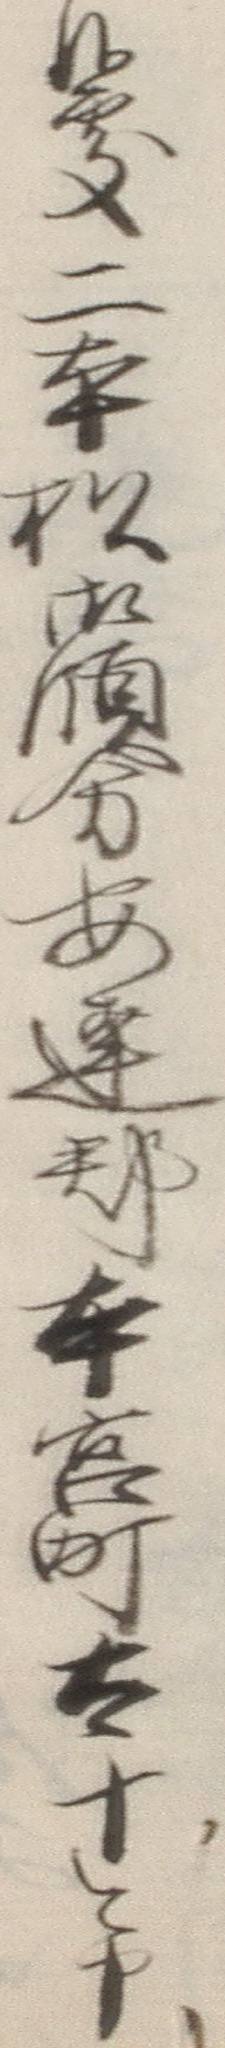且処二本松御領分安達郡本宮町太十と申
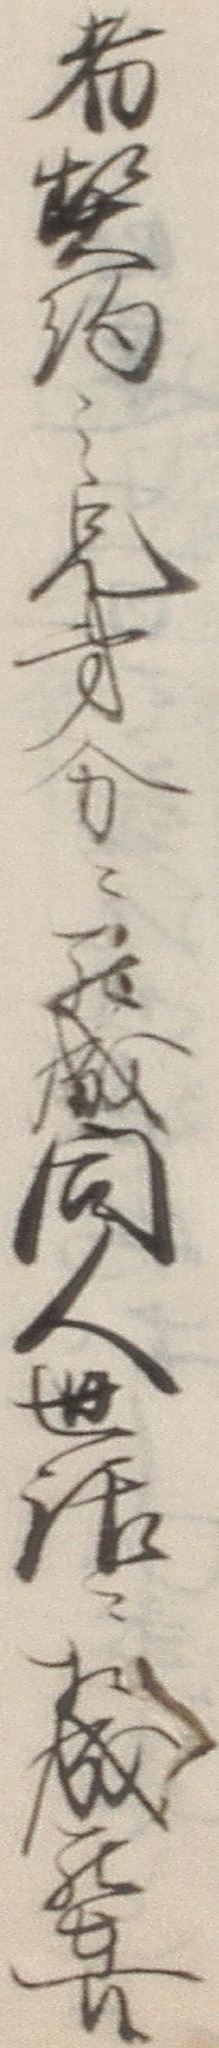者契約の兄弟分に罷成同人世話ニ相成罷在候
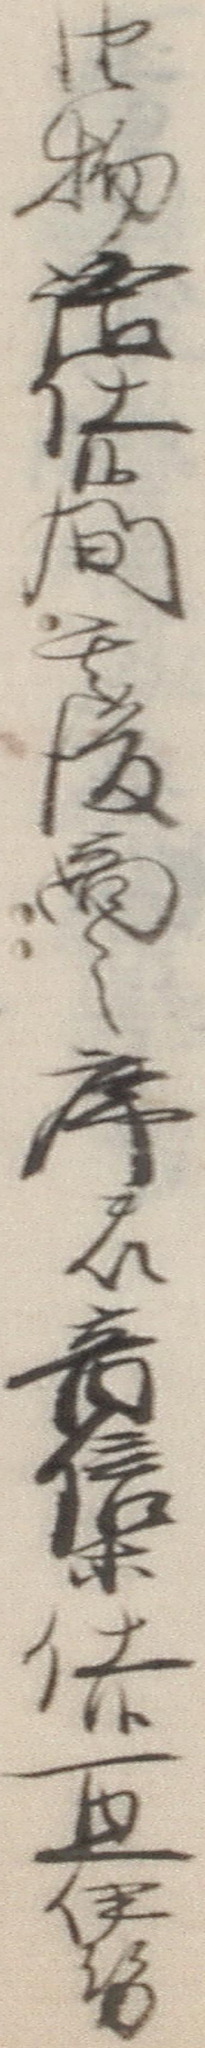由物語仕候間其後商の序ヲ以音信等仕候一且伊勢
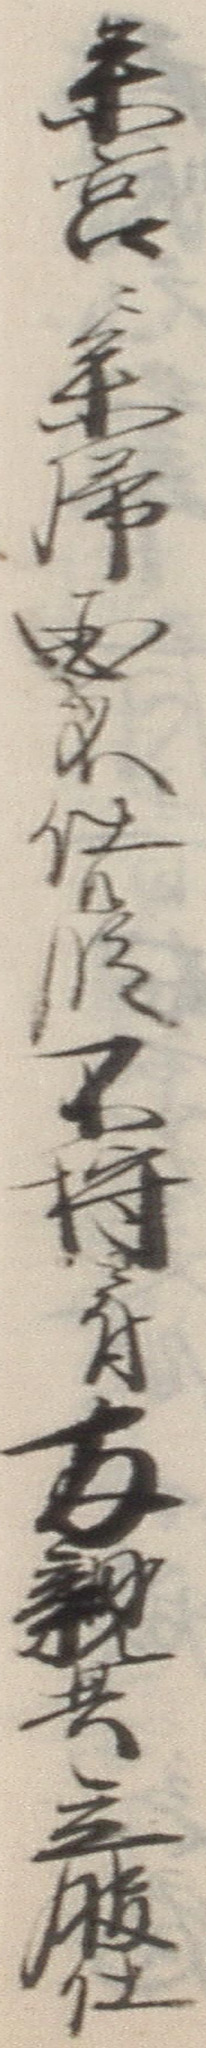参宮に参帰国不仕候段不埒ニ付両親共立腹仕
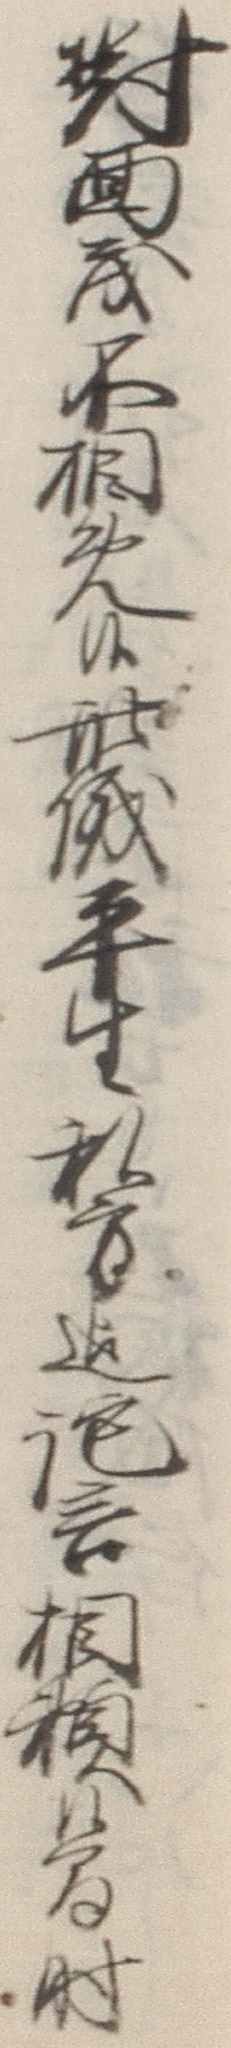対面も不相免候此義平生私方迄詫言相頼候間時
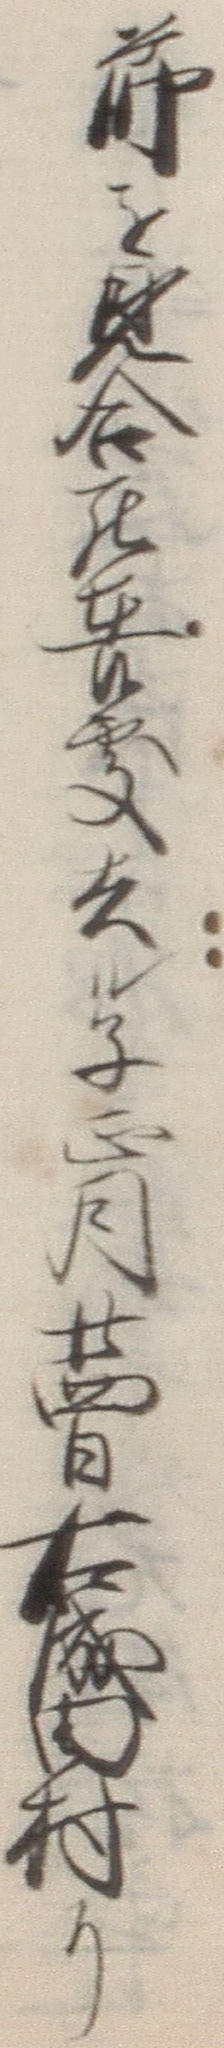節を見合罷在候去ル子正月廿四日右成田村に
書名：[諸国災害記録]
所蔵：東京大学地震研究所図書室 Earthquake Research Institute Library, The University of Tokyo, JAPAN
